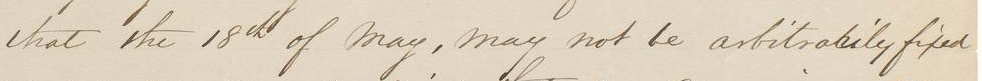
that the 18th of May, may not be arbitrarily fixed
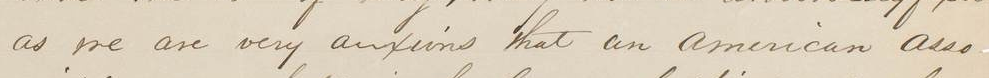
as we are very anxious that an American Asso-
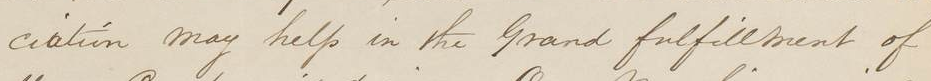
ciation may help in the Grand fulfillment of
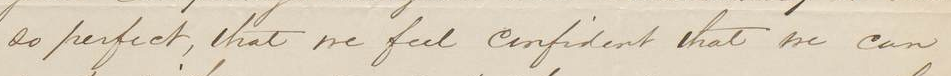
so perfect, that we feel confident that we can
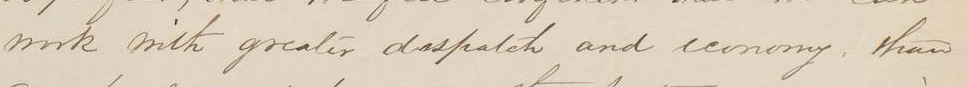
work with greater dispatch and economy, than
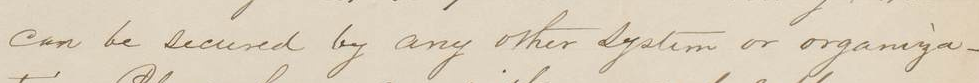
can be secured by any other system or organiza-
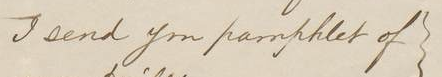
I send you pamphlet of
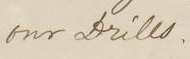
our Drills.
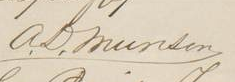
A. D. Munsen
